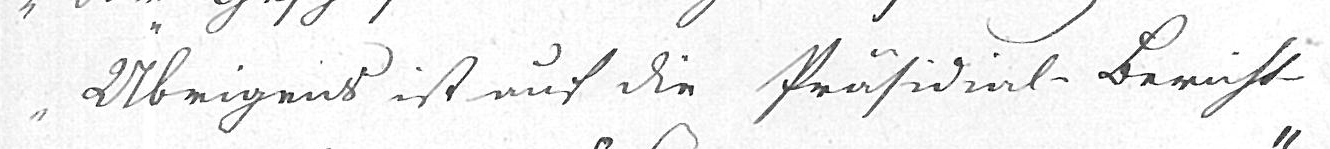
"Übrigens ist auf die Präsidial-Bericht-
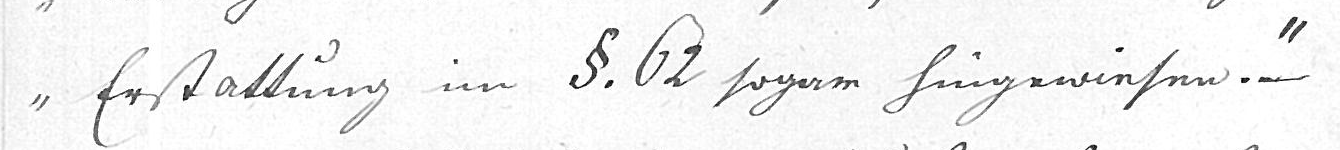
"Erstattund im § 62 sogar hingewiesen."
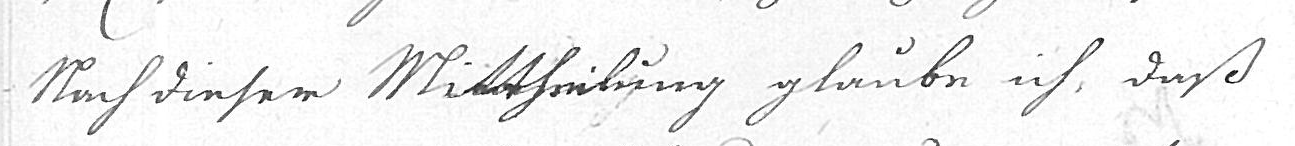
Nach dieser Mittheilung glaube ich, daß
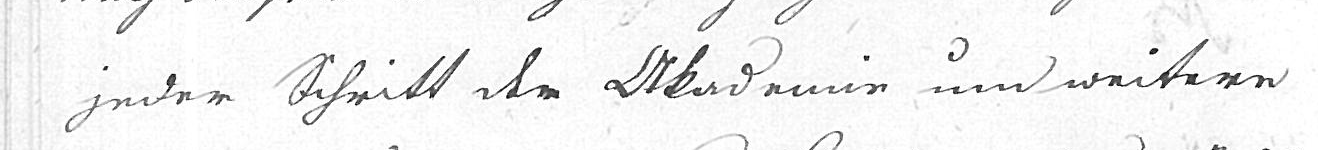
jeder Schritte der Akademie um weitere
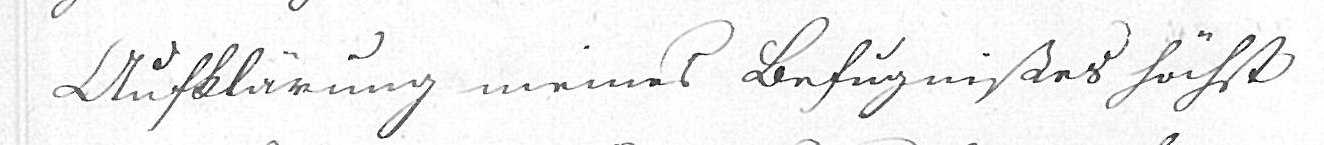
Aufklärung meines Befugnißes höchst
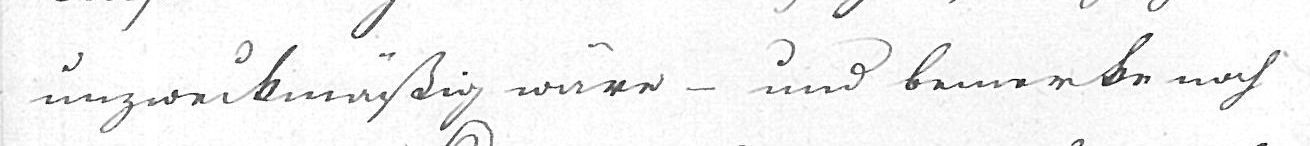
unzweckmäßig wäre - und bemerke noch
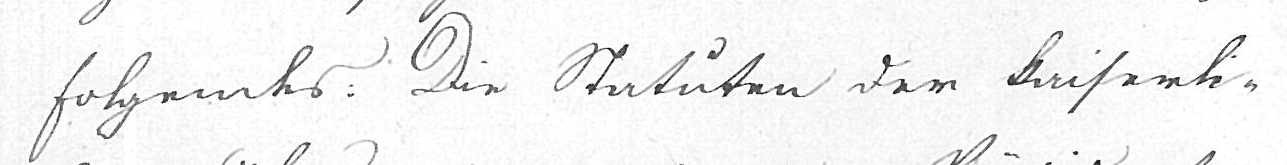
folgendes: Die Statuten der kaiserli-
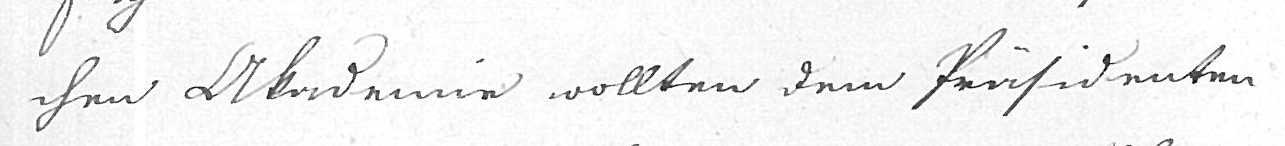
chen Akademie wollten dem Präsidenten
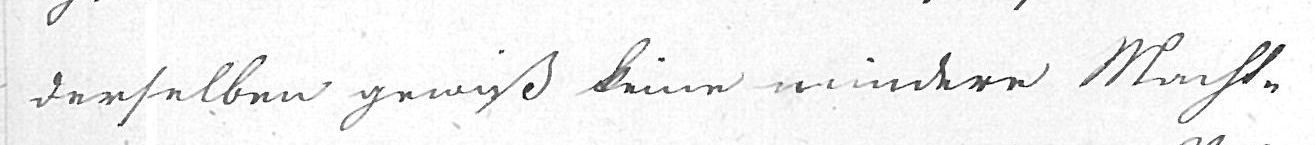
derselben gewiß keine mindere Macht-
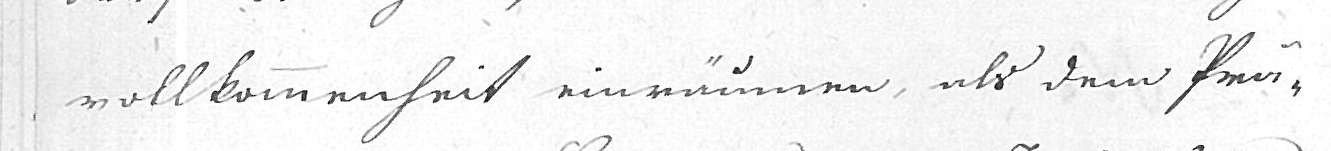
vollkommenheit einräumen, als dem Prä-
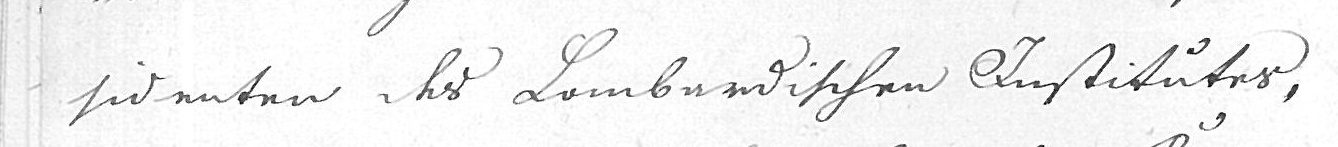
sidenten des Lombardischen Institues,
